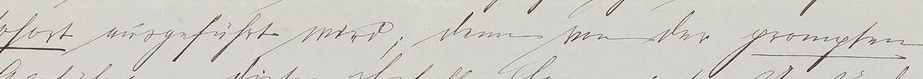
sofort ausgeführt wird; denn von der prompten
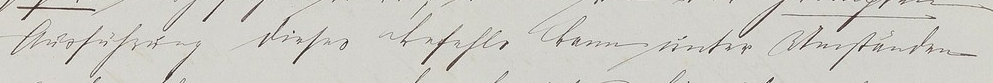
Ausführung dieses Befehls kann unter Umständen
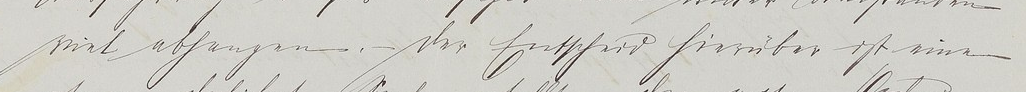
viel abhangen. – Der Entscheid hierüber ist eine
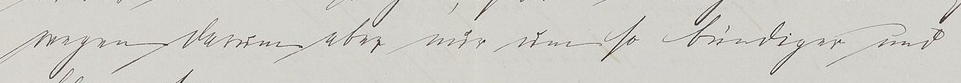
wegen darum aber nur um so bündiger und
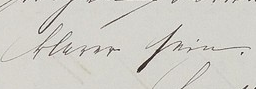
klarer sein.
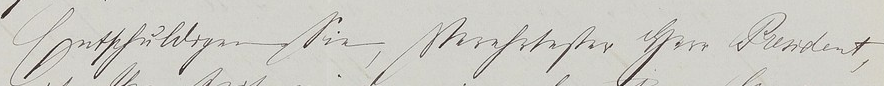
Entschuldigen Sie, Verehrtester Herr President,
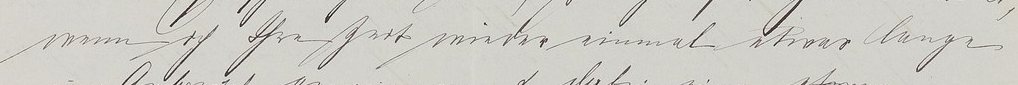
wenn ich Ihre Zeit wieder einmal etwas lange
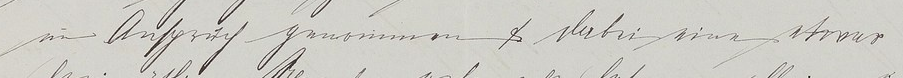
in Anspruch genommen & dabei eine etwas
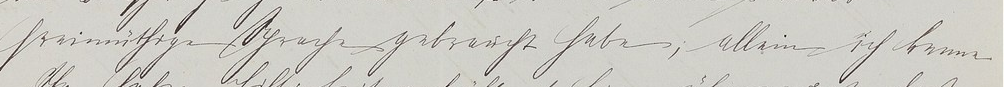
freimüthige Sprache gebraucht habe; allein ich kenne
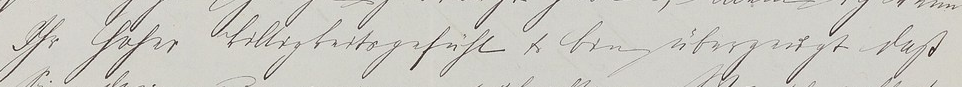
Ihr hohes Billigkeitsgefühl & bin überzeugt daß
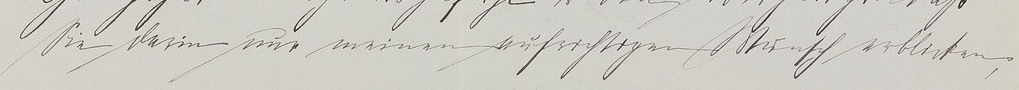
Sie darin nur meinen aufrichtigen Wunsch erblicken,
